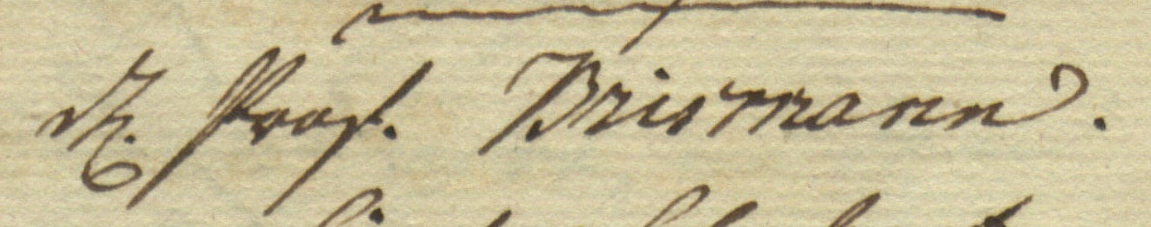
dh. Prof. Brismann.
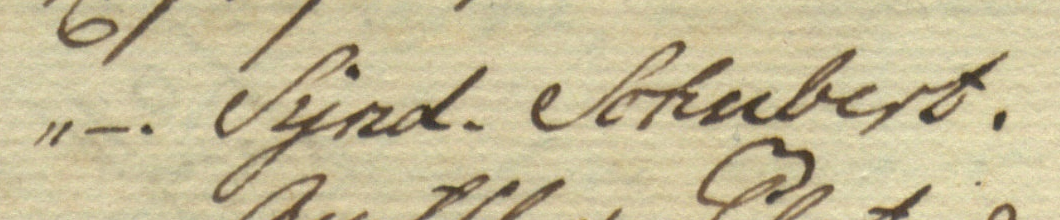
Sÿnd. Schubert
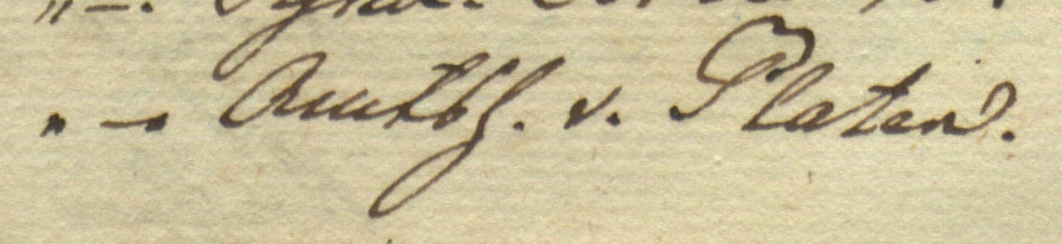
Amtsh. v. Platen.
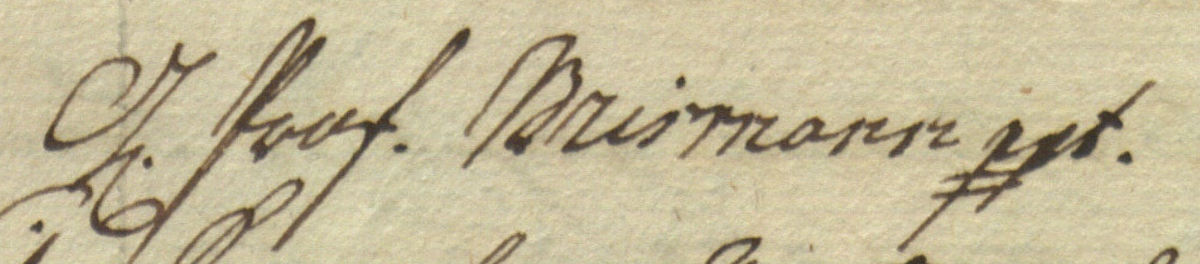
dh. Prof. Brismann ppt.
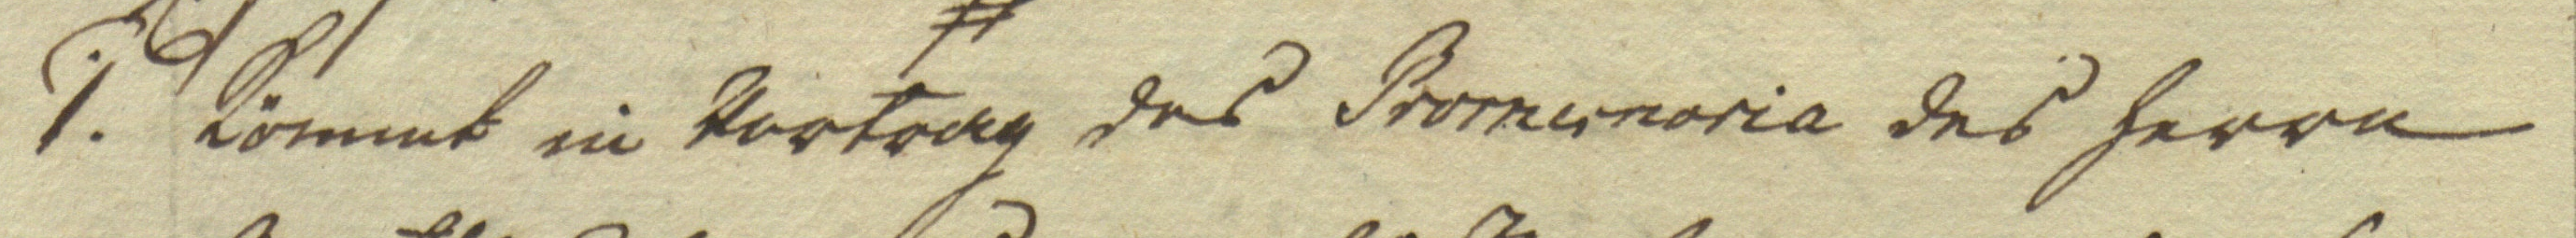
1. Kömmt in Vortrag das Promemoria des Herrn
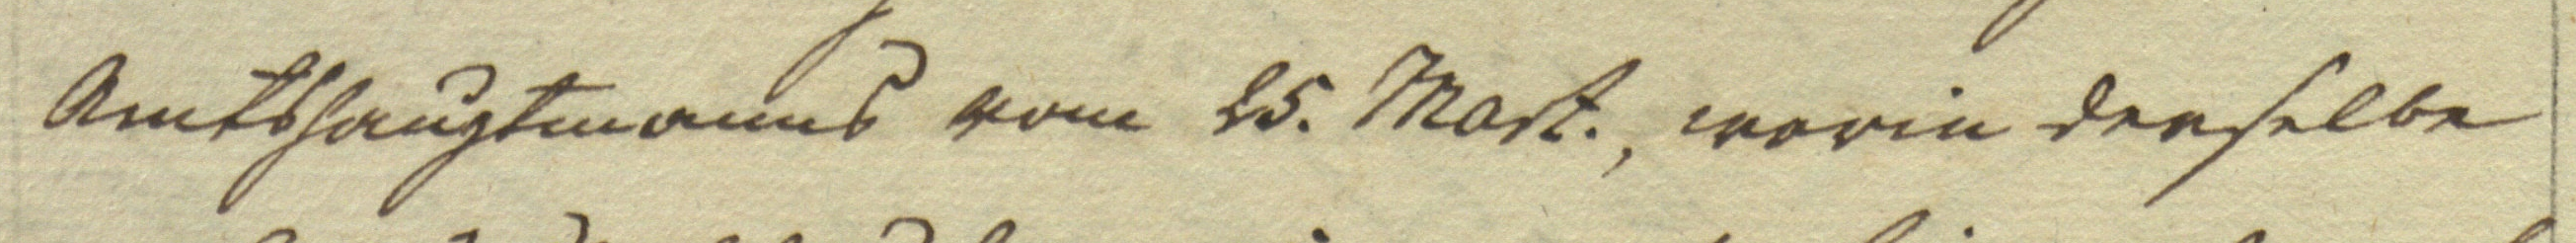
Amtshauptmanns vom 25. Mart., worin derselbe
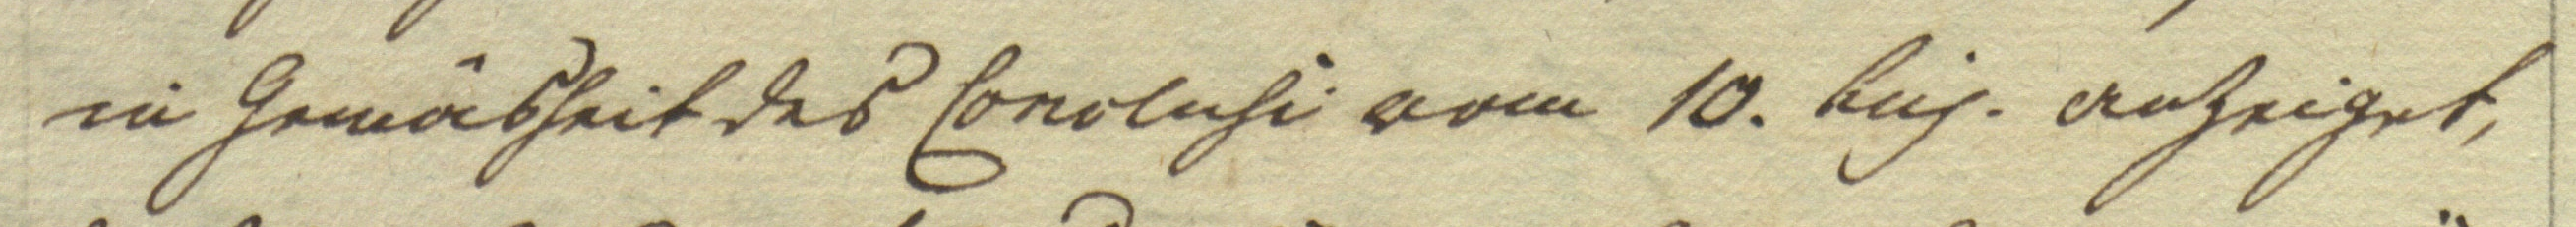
in Gemäsheit des Conclusi vom 10. huj. anzeiget,
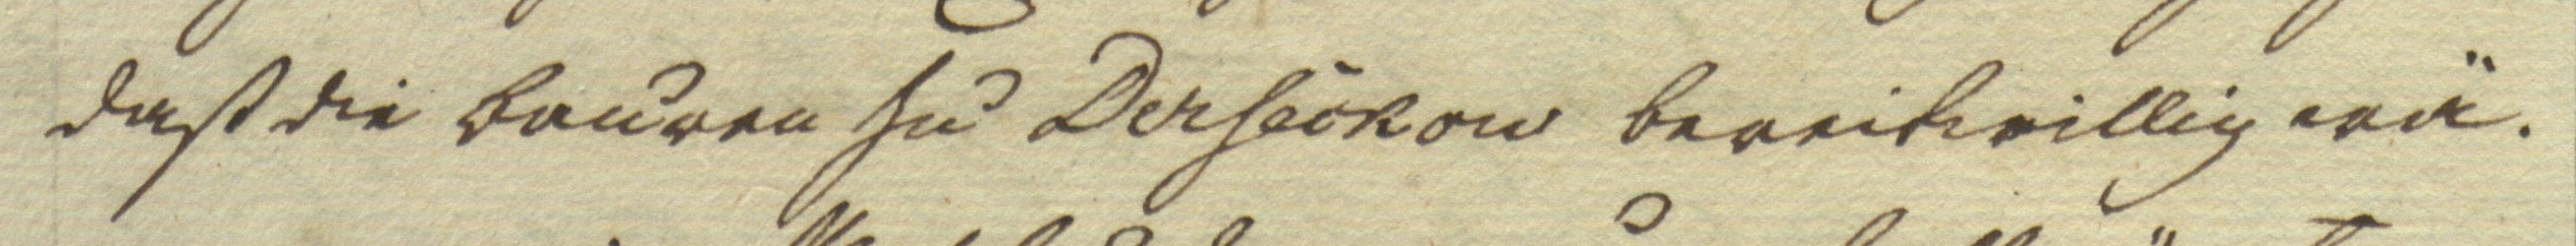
daß die Bauren zu Derseckow bereitwillig wä¬
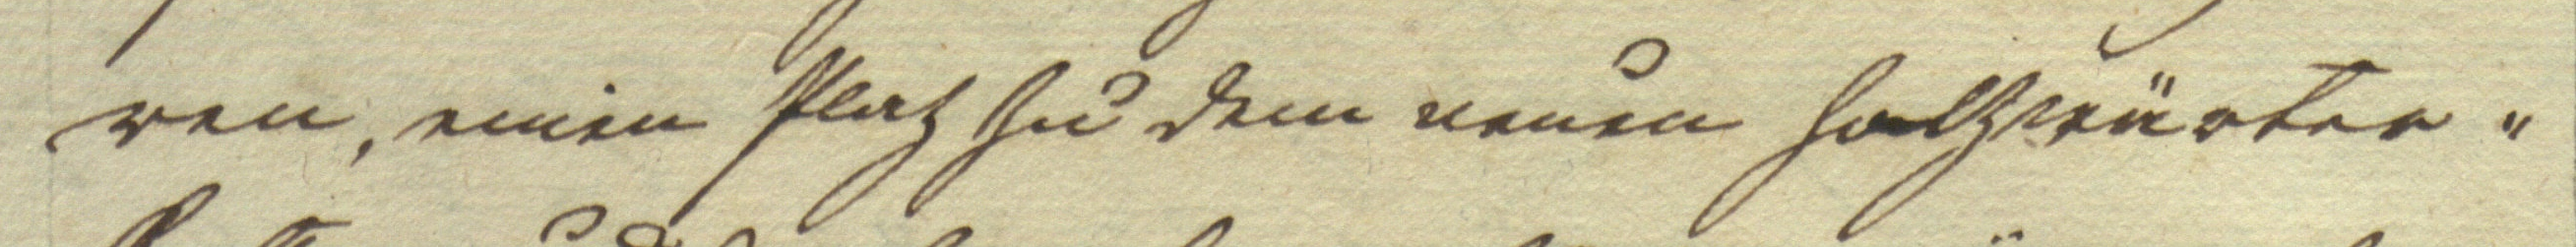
ren, einen Platz zu dem neuen Holzwärter¬
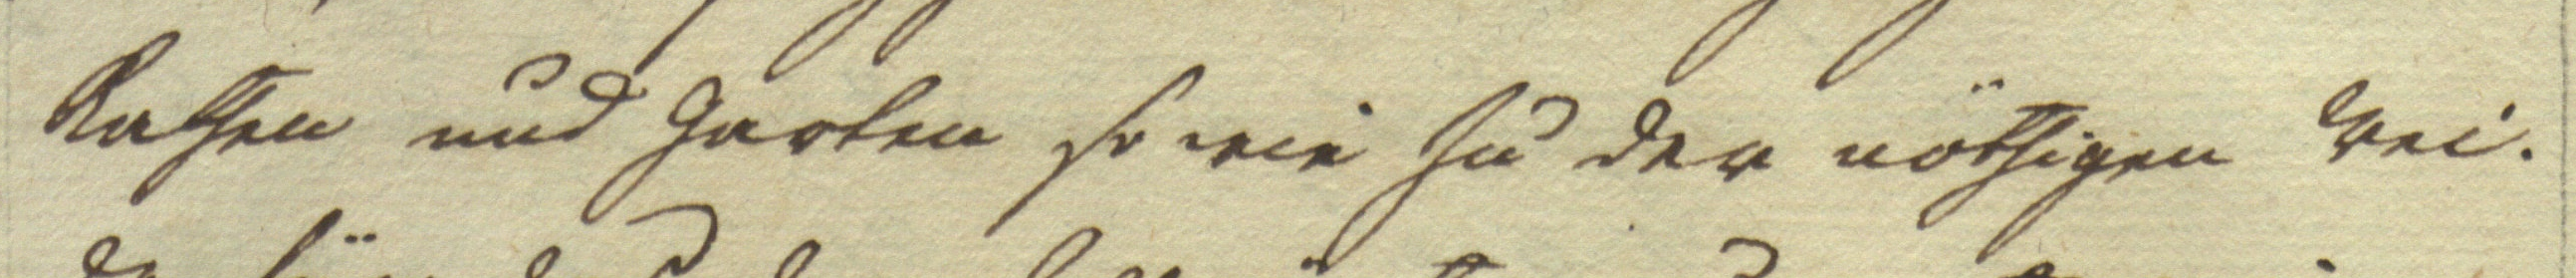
Kathen und Garten so wie zu der nöthigen Wei¬
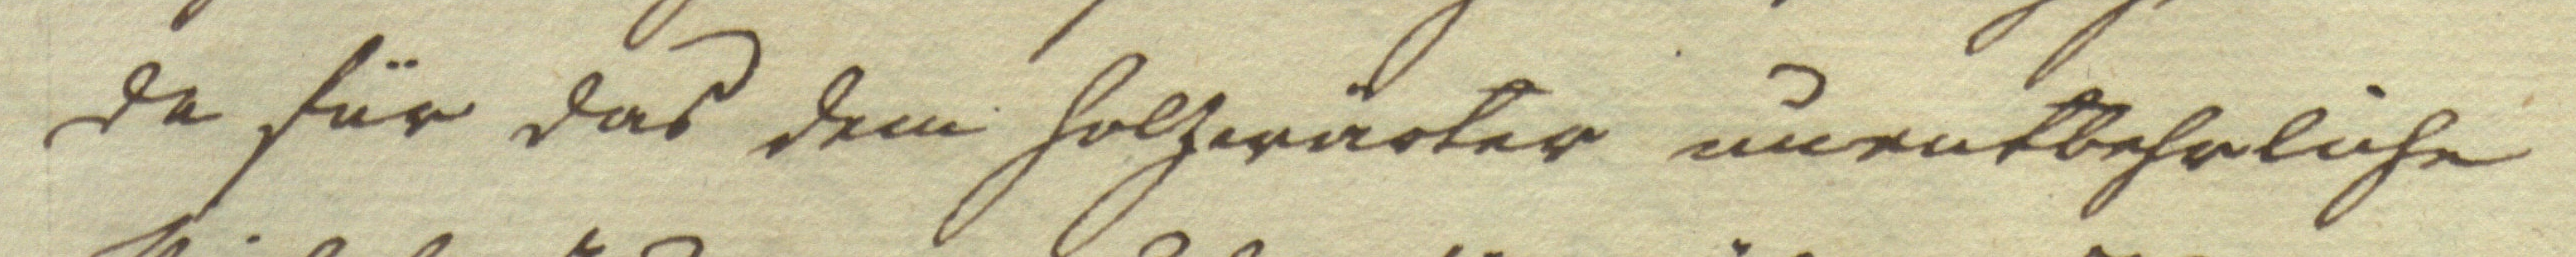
de für das dem Holzwärter unentbehrliche
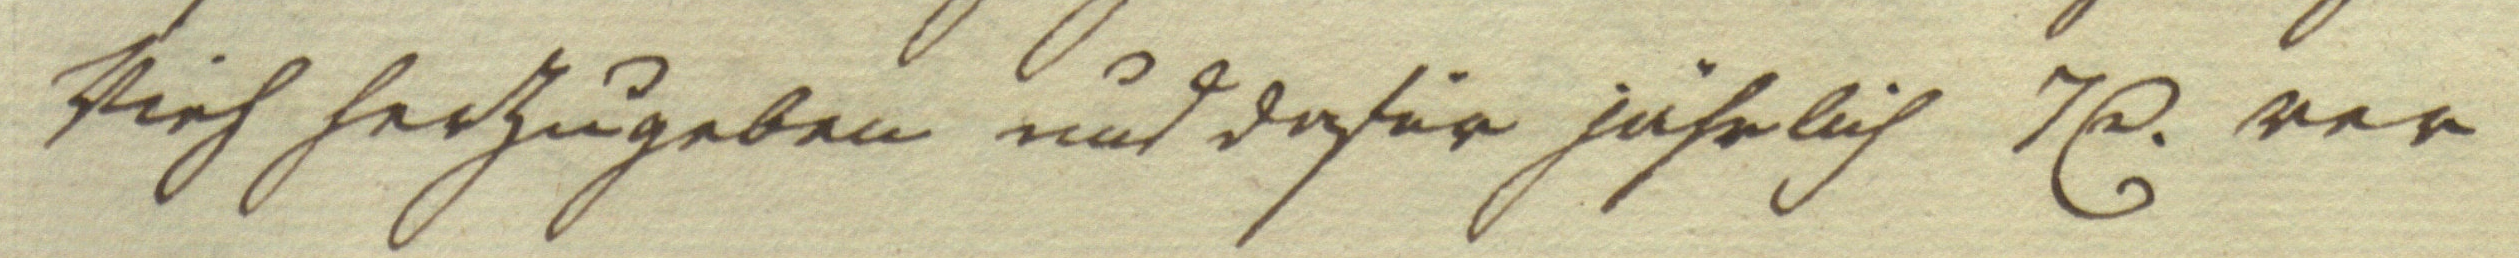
Vieh herzugeben und dafür jährlich 7 l. ver¬
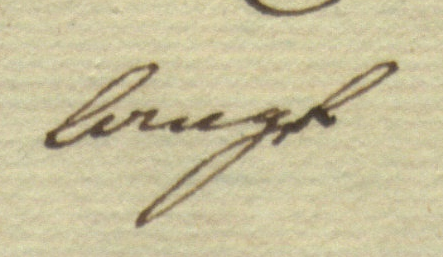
langt
